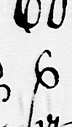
Fr¬
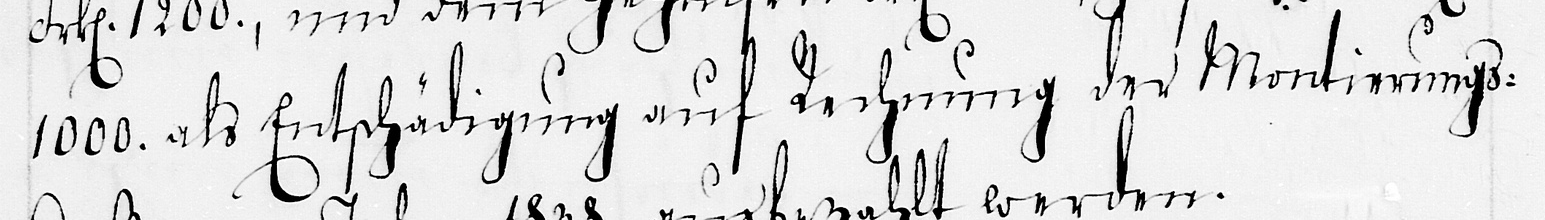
1000. als Entschädigung auf Rechnung der Montierung¬
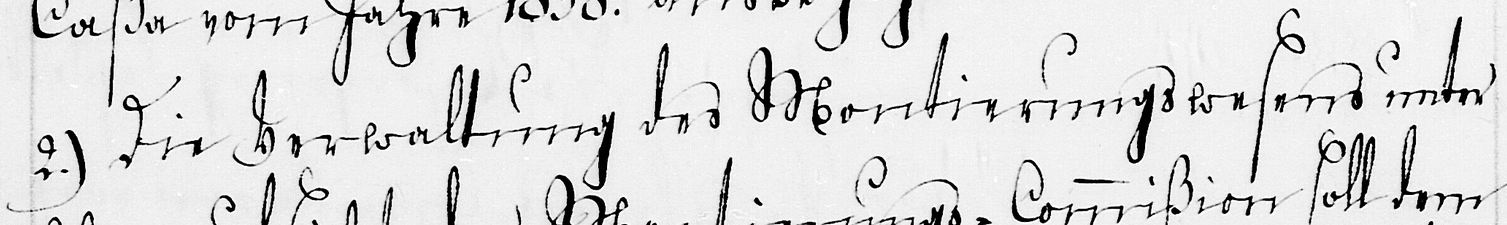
2.) Die Verwaltung des Montierungswesens unter
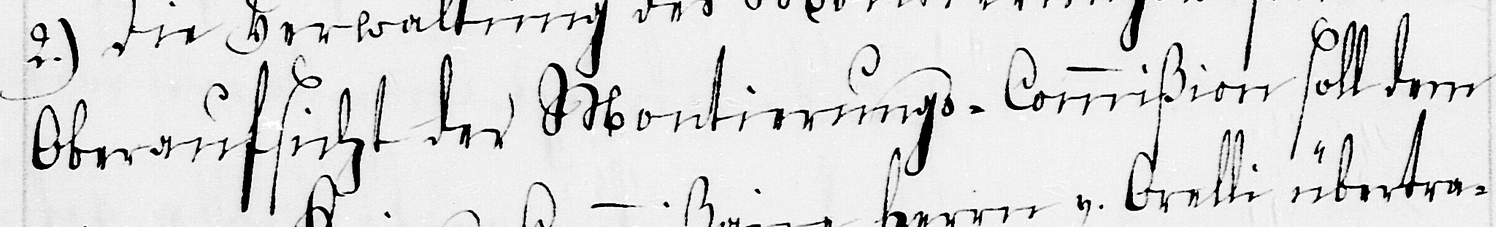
Oberaufsicht der Montierungs-Commißion soll dem
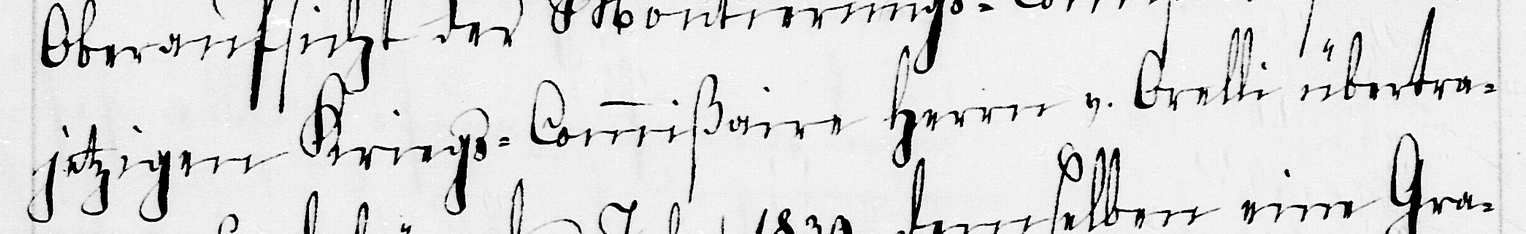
jetzigen Kriegs-Commißaire Herrn v. Orelli übertra¬
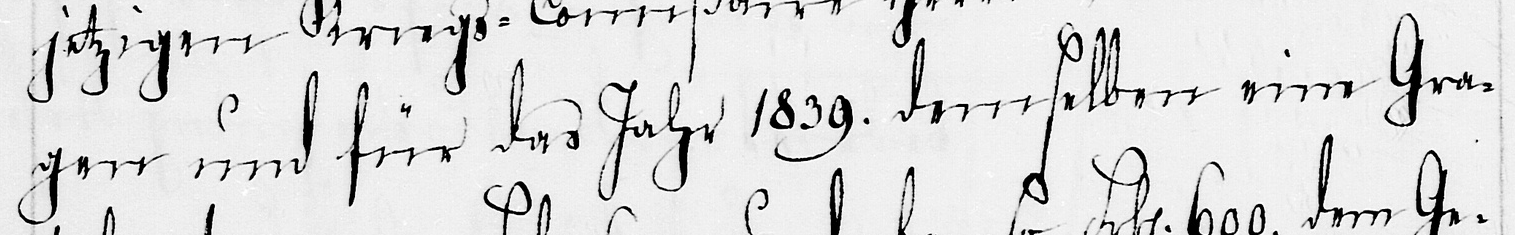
gen und für das Jahr 1839. demselben eine Gra¬
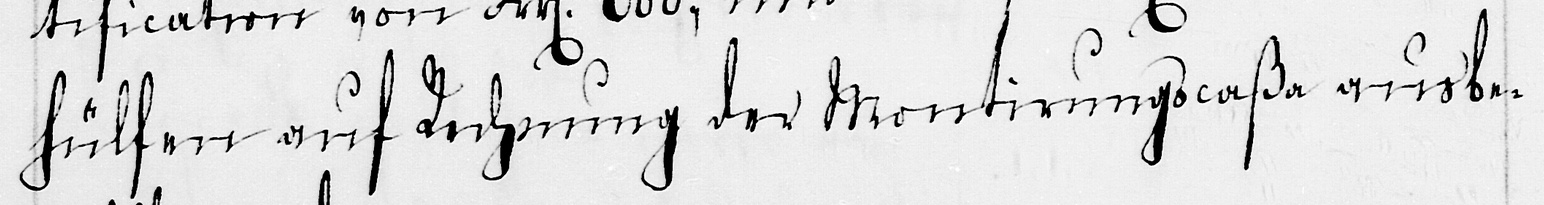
hülfen auf Rechnung der Montierungscaßa ausbe¬
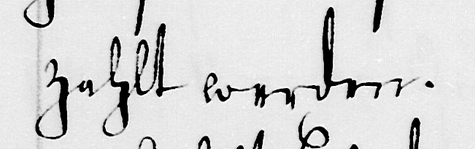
zahlt werden.
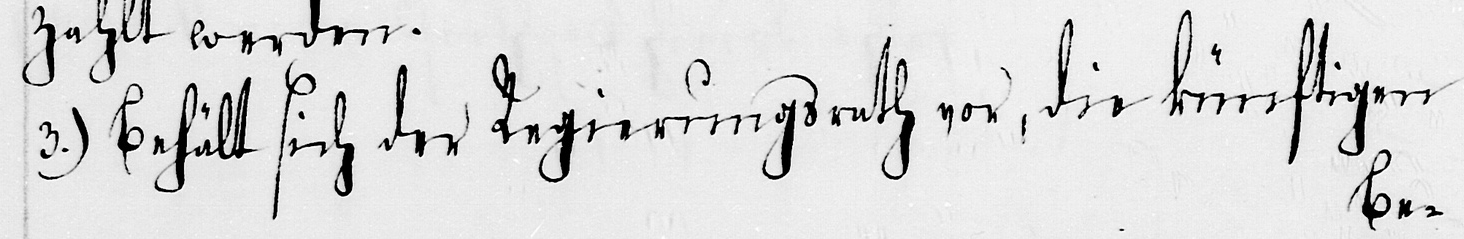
3.) Behält sich der Regierungsrath vor, die künftigen
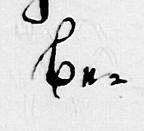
Ge¬
